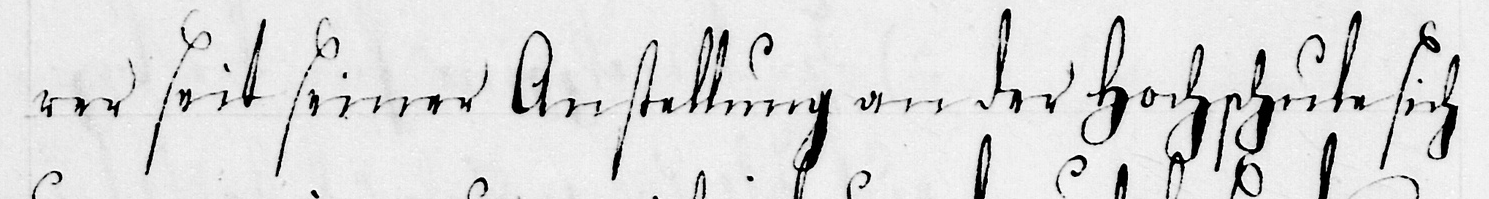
rer seit seiner Anstellung an der Hochschule sich
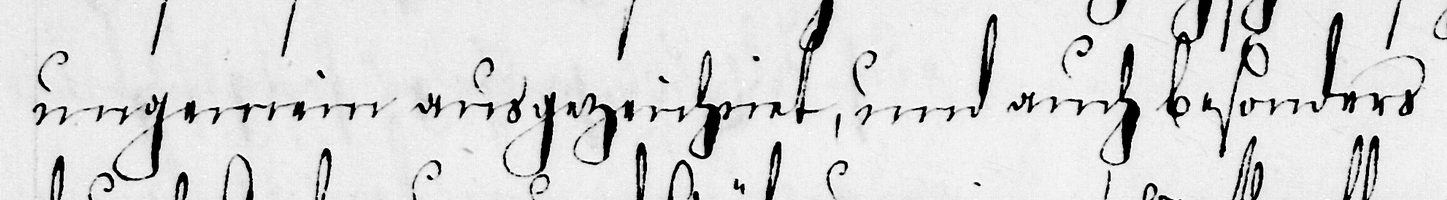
ungemein ausgezeichnet, und auch besonders
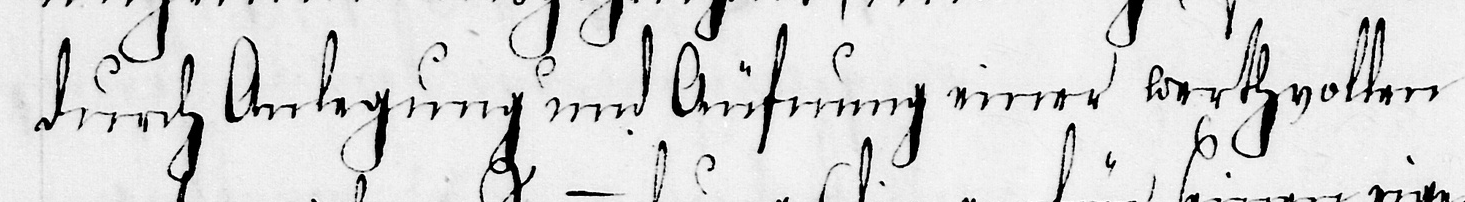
durch Anlegung und Äufnung einer werthvollen
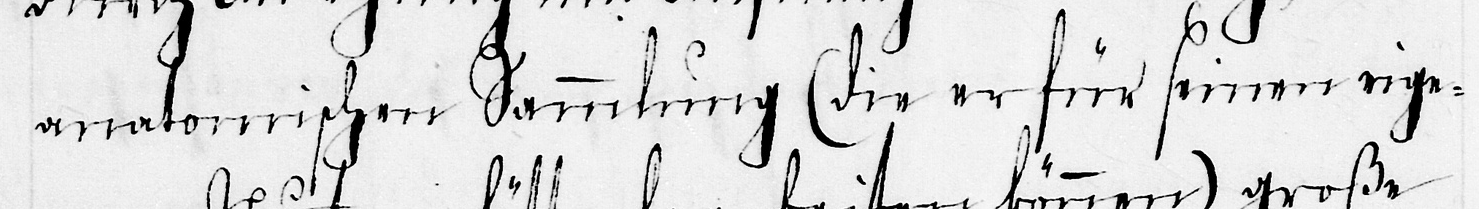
anatomischen Sammlung (die er für seinen eige¬
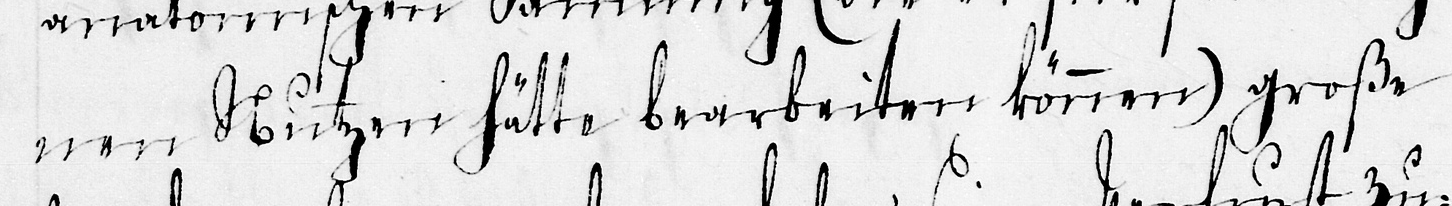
nen Nutzen hätte bearbeiten können) große
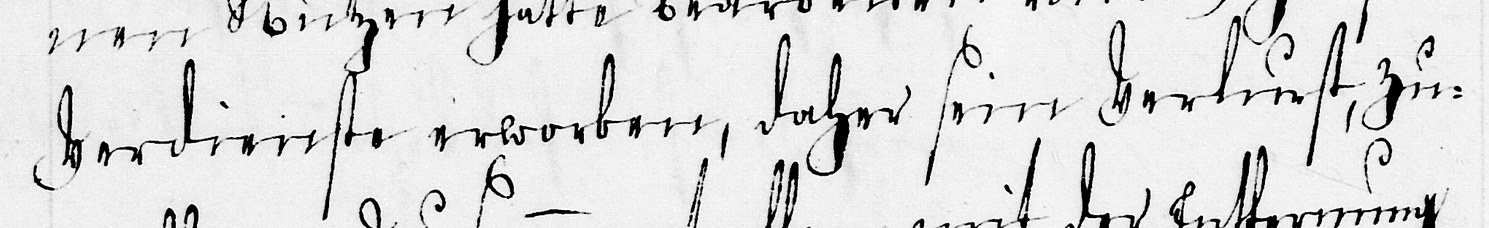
Verdienste erworben, daher sein Verlurst, zu¬
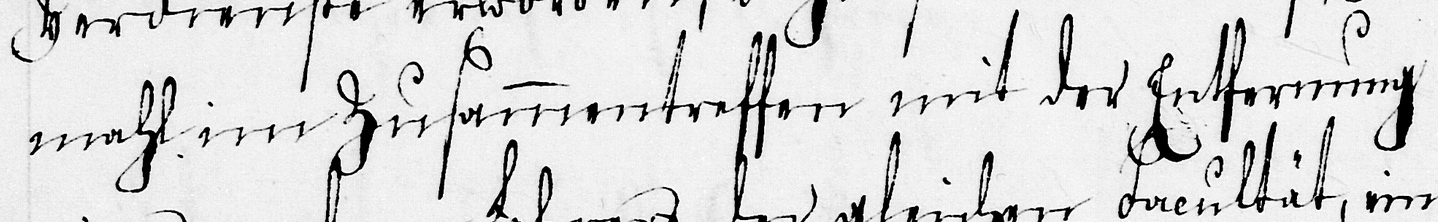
mahl im Zusammentreffen mit der Entfernung
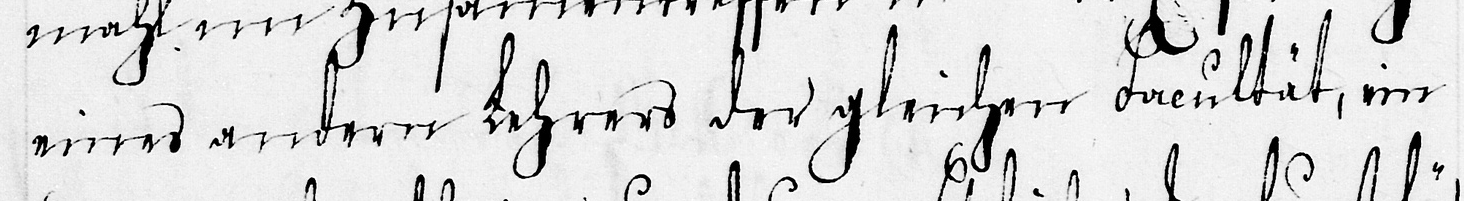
eines andern Lehrers der gleichen Facultät, ein
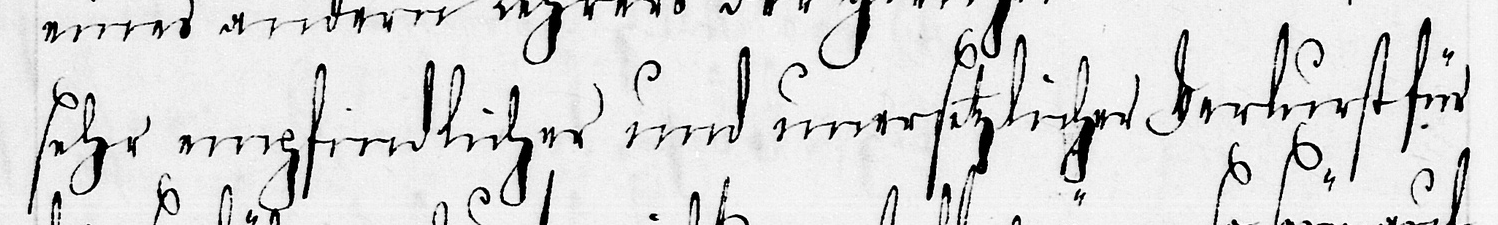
sehr empfindlicher und unersetzlicher Verlurst für
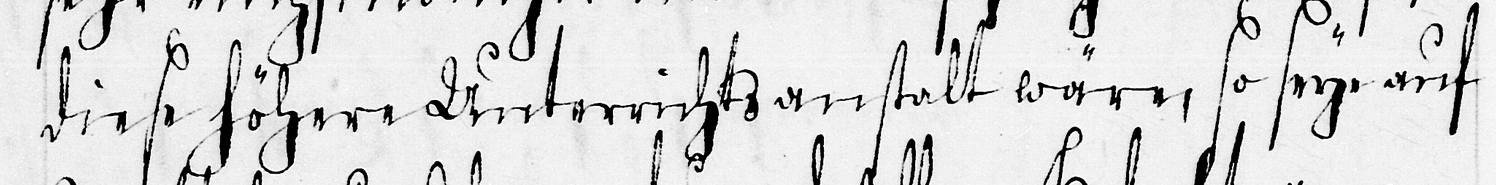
diese höhere Unterrichtsanstalt wäre, so seye auf
